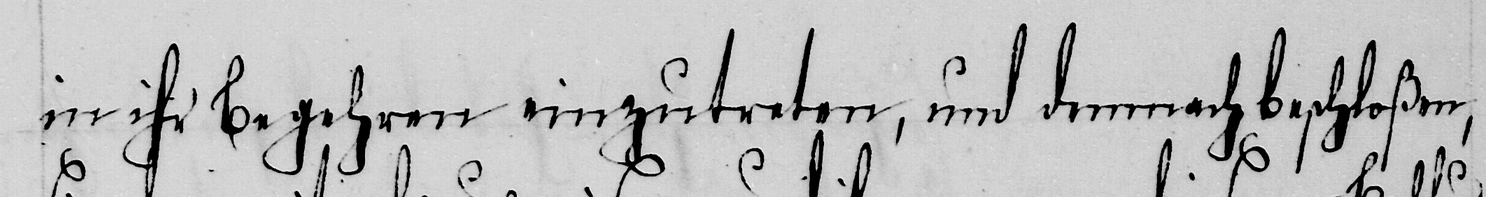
in ihr Begehren einzutreten, und demnach beschloßen,
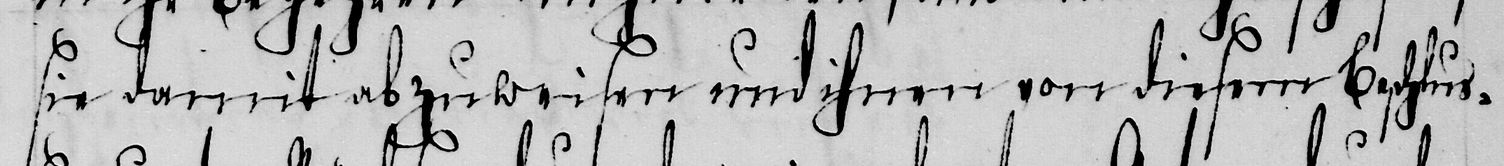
sie damit abzuweisen und ihnen von diesem Beschlu¬
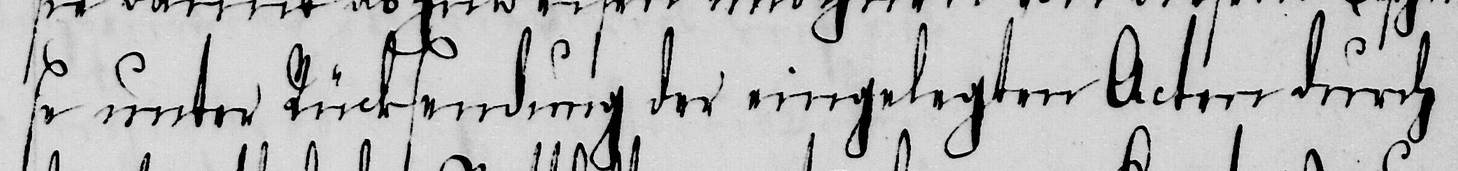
ße unter Rücksendung der eingelegten Acten durch
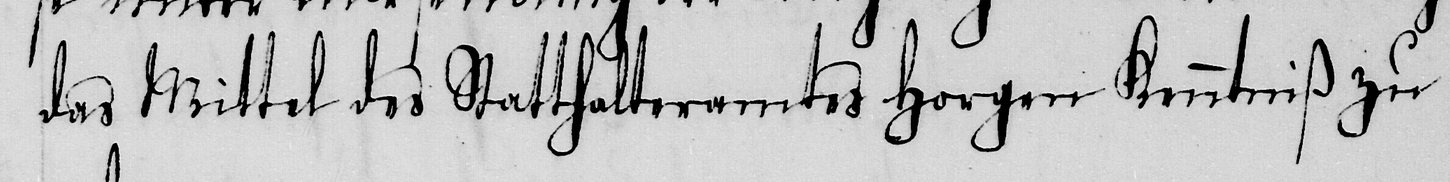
das Mittel des Statthalteramtes Horgen Kenntniß zu
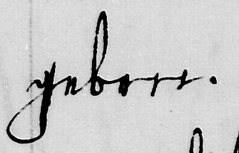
geben.
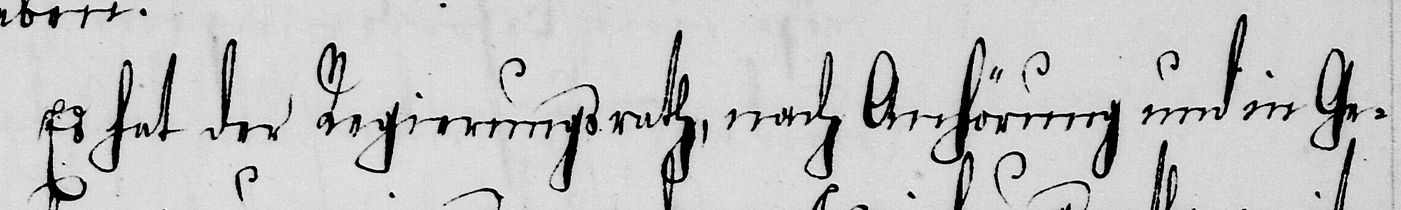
Es hat der Regierungsrath, nach Anhörung und in Ge¬
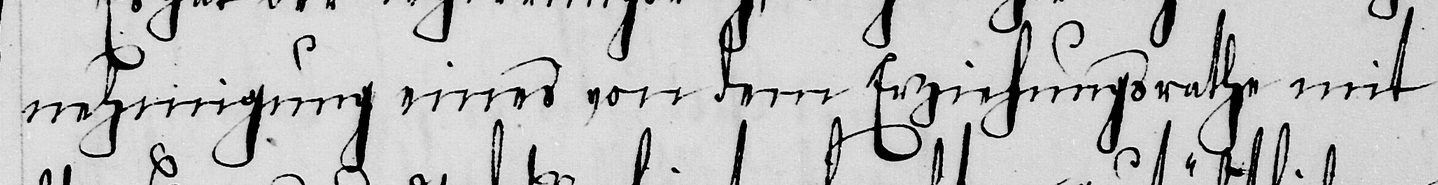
nehmigung eines von dem Erziehungsrathe mit
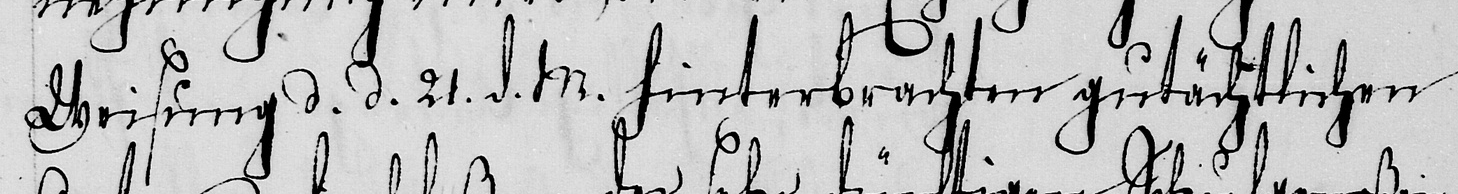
Weisung d. d. 21. d. M. hinterbrachten gutächtlichen
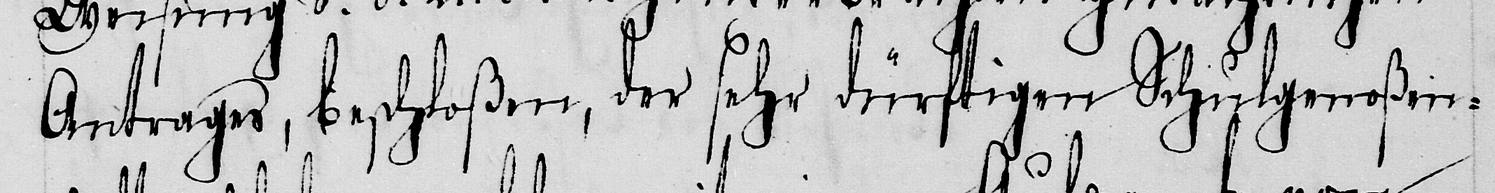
Antrages, beschloßen, der sehr dürftigen Schulgenoßen¬
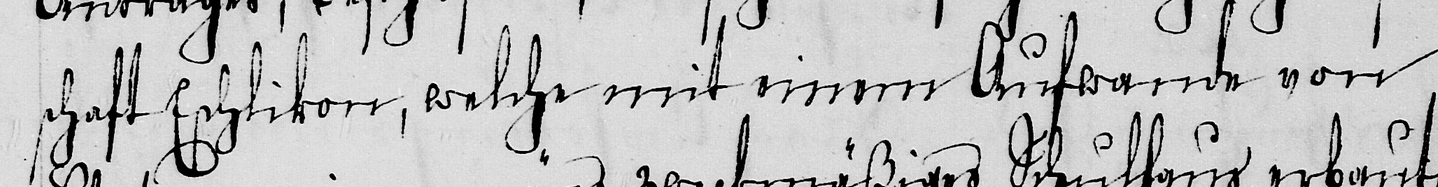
schaft Eschlikon, welche mit einem Aufwande von
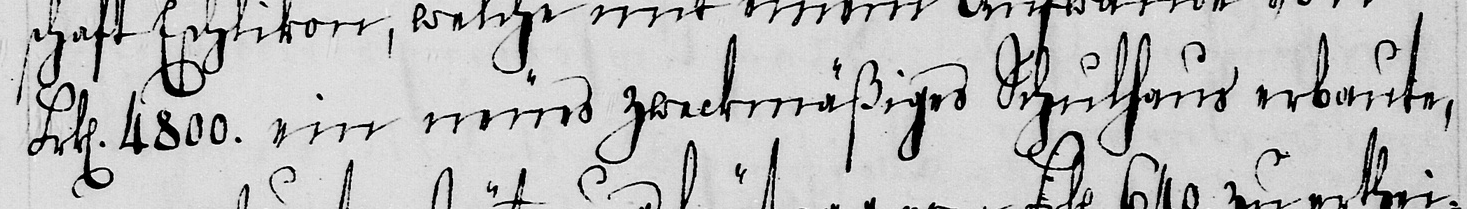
k[en]. 4800. ein neues zweckmäßiges Schulhaus erbaute,
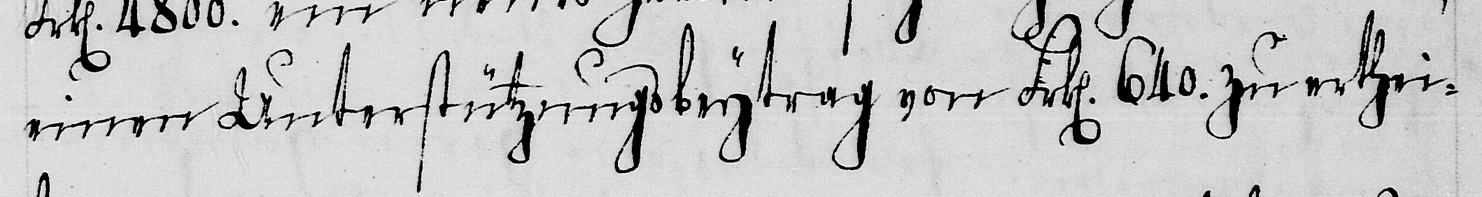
einen Unterstützungsbeytrag von Frk[en]. 640. zu erthei¬
